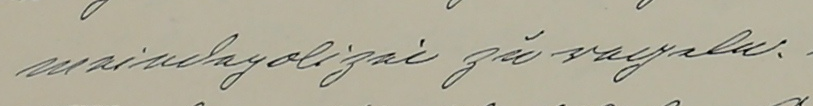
meindepolizei zu regeln.
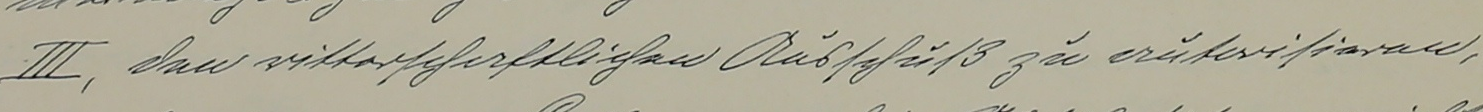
III. den ritterschaftlichen Ausschuß zu autorisieren,
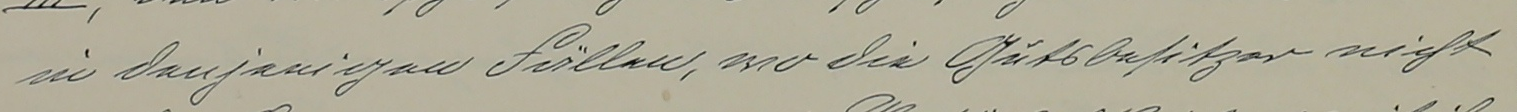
in denjenigen Fällen, wo die Gutsbesitzer nicht
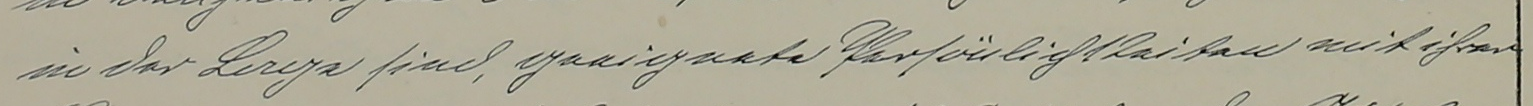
in der Lage sind, geeignete Persönlichkeiten mit ihrer
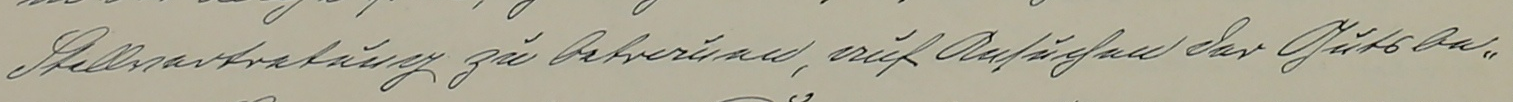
Stellvertretung zu betrauen, auf Ansuchen der Gutsbe-
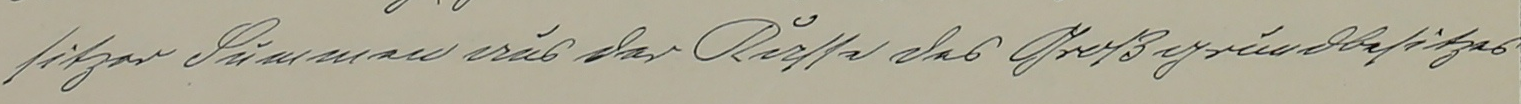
sitzer Summen aus der Kasse des Großgrundbesitzes
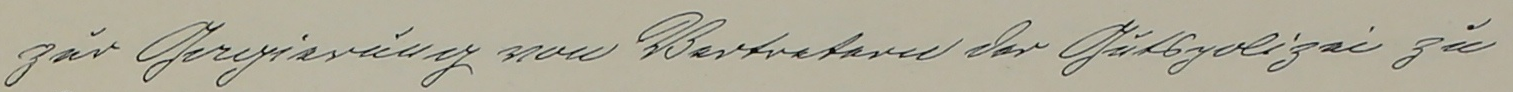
zur Gagierung von Vertretern der Gutspolizei zu
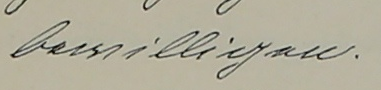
bewilligen.
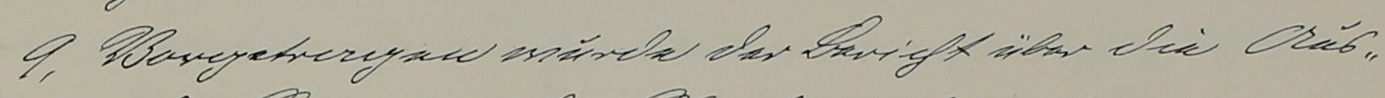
9. Vorgetragen wurde der Bericht über die Aus-
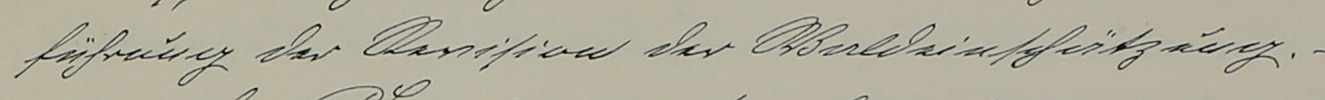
führung der Revision der Waldeinschätzung.
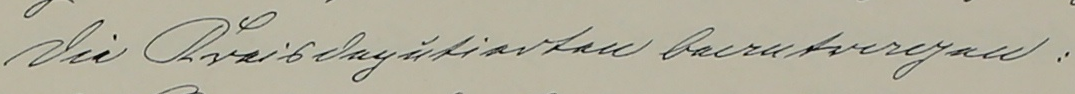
Die Kreisdeputierten beantragen:
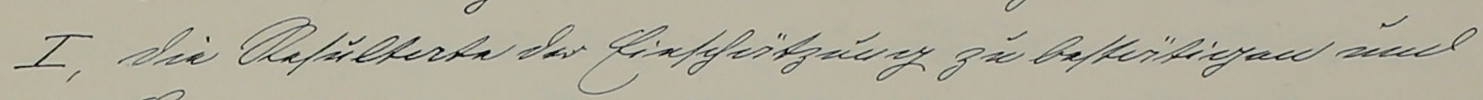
I. die Resultate der Einschätzung zu bestätigen und
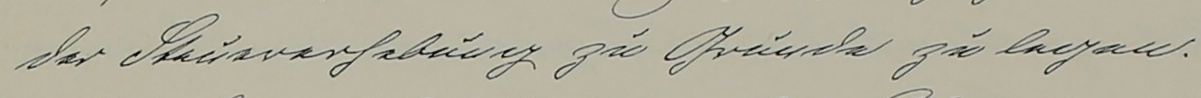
der Steuererhebung zu Grunde zu legen.
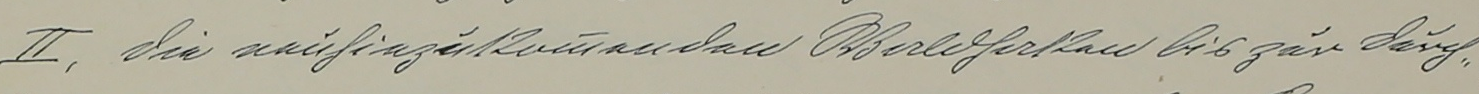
II. die neuhinzukommenden Waldhaken bis zur Durch-
